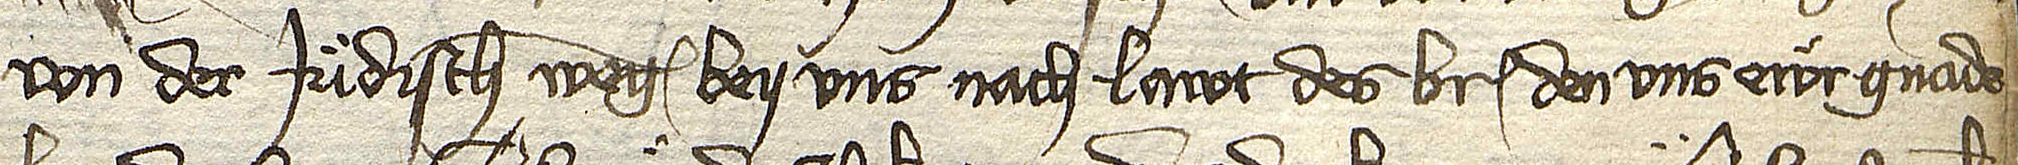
von der Iüdiſch* weg* bey vns nach lawt des br* den vns eẅr gnade
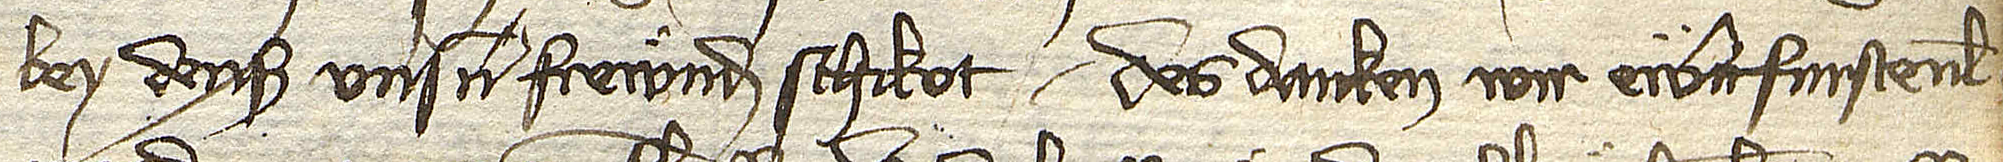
bey denſ* vnſn* freẅnd* ſchiket / Des danken wir eẅ*r furſtenl*
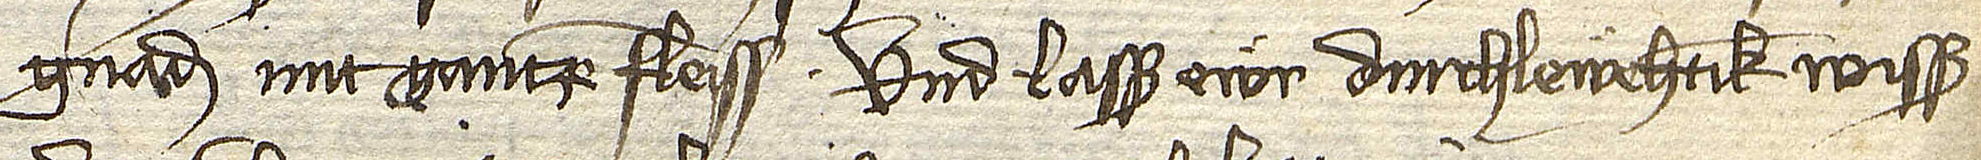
gnad* mit gancʒe* fleiſſ . Vnd laſſ* eẅr durchleẅchtik* wiſſ*
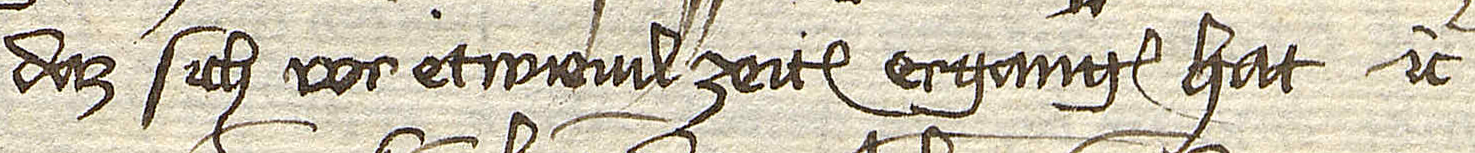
daʒ ſich vor etwieuil ʒeit* ergang* hat ec*
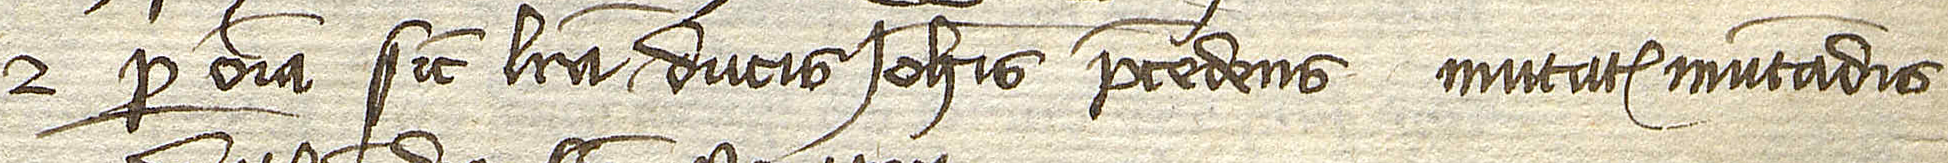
@ p* oia* ſic* lra* / ducis Ioh*is p*cedens mutat* muta*dis
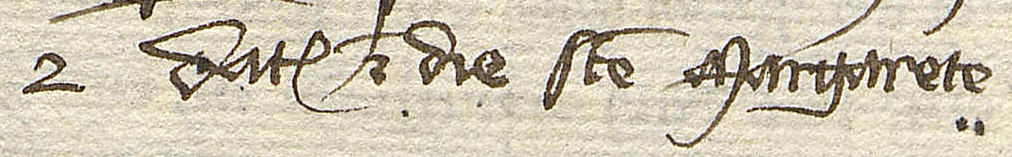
@ Dat* i* die ſte* Margarete
